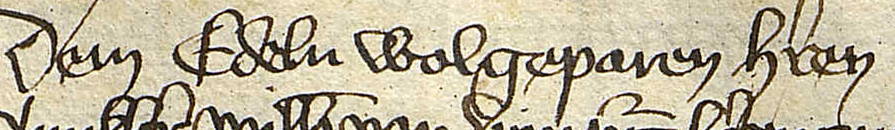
Dem Edeln wolgeporen h*ren
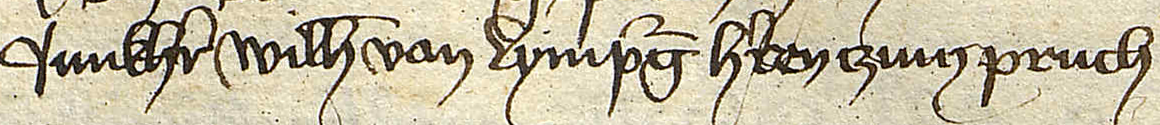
Iunkh*r wilh* von Lymp*g h*ren cʒum pruch
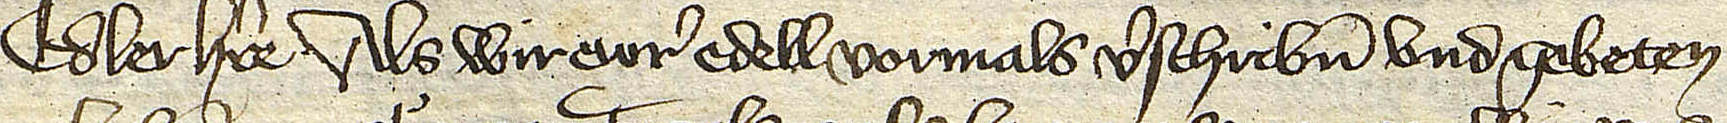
Edler h*re . Als wir ew*r edell vormals v*ſchrib*n vnd gebeten
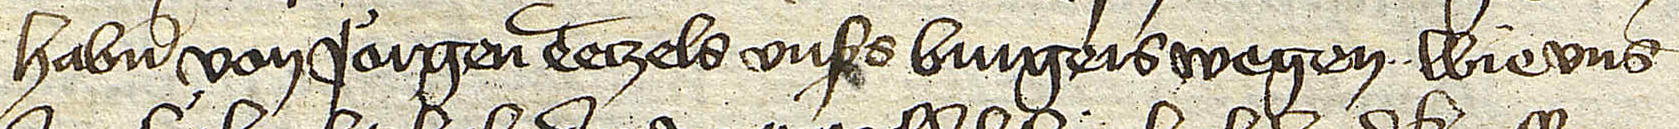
hab*n von Iörgen Tecʒels vnſ*s burgers wegen ~ wie vns
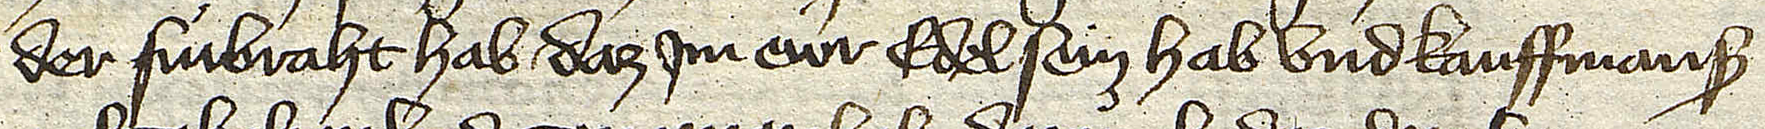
der fürbraht hab / daʒ Im ewr Edel ſein hab vnd kauffmanſ*
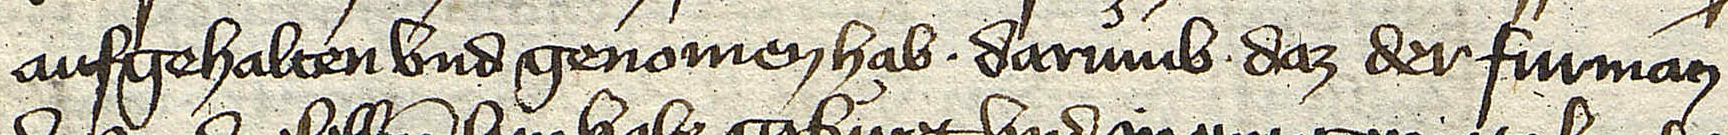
aufgehalten vnd genomen hab . darümb . daʒ der furman
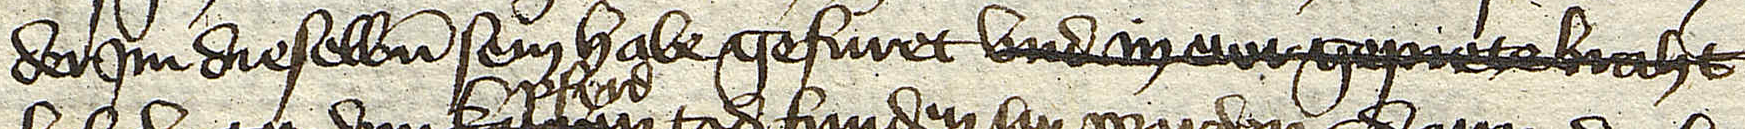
der Im dieſelb*n ſein habe gefüret vnd in ewr gepiete braht
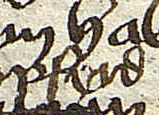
pferd
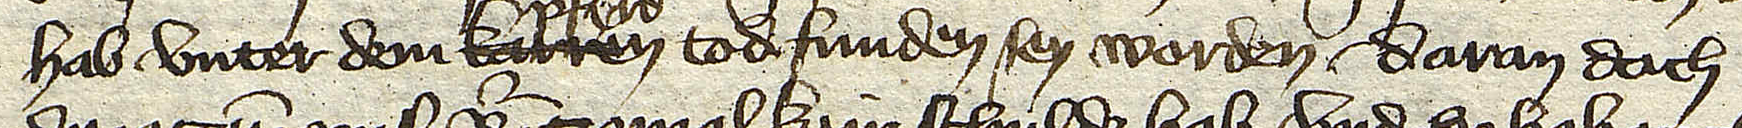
hab / vnter dem karren tod funden ſey worden / daran doch
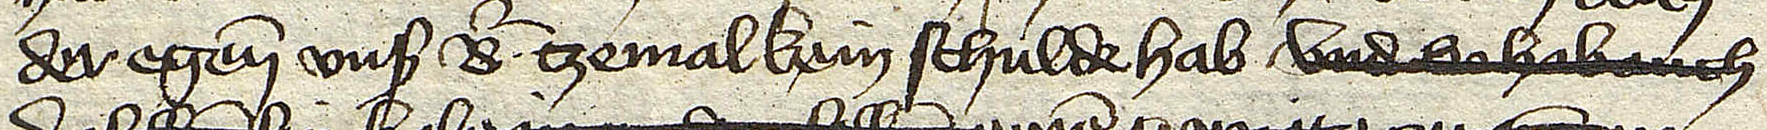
der egen* vnſ* B* . cʒemal kein ſchulde hab / vnd Er habe auch
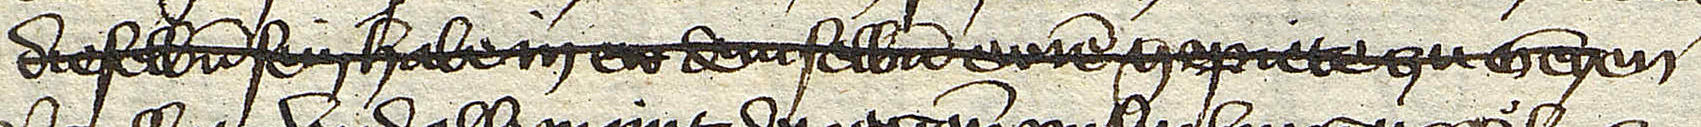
dieſelb*n ſein habe in ew demſelbn* ewre* gepiete cʒu Geyen
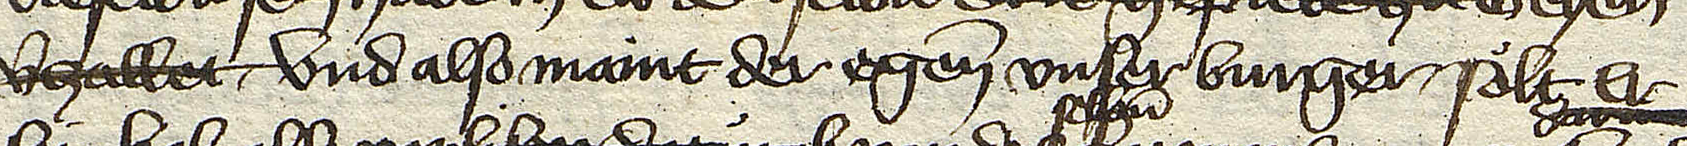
v*cʒollet / Vnd alſo maint der egen* vnſer burger / ſölt Er
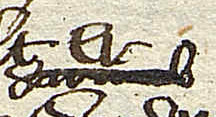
darumb
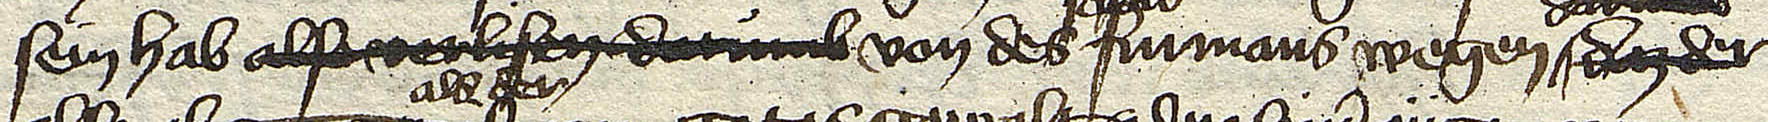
ſein hab alſo verliſen darümb von des furmans wegen / daʒ der
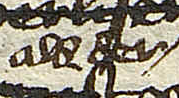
als der
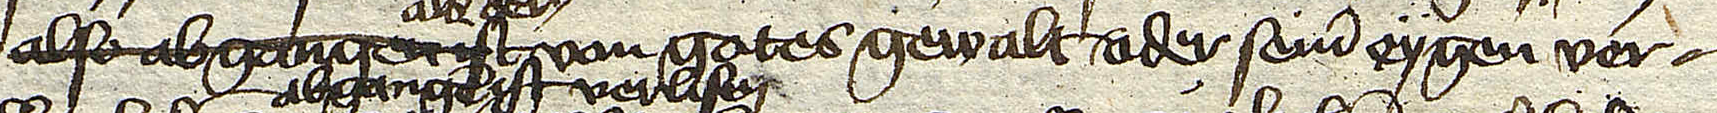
alſo abgangen iſt von gotes gewalt / oder ſein* eygen ver =
